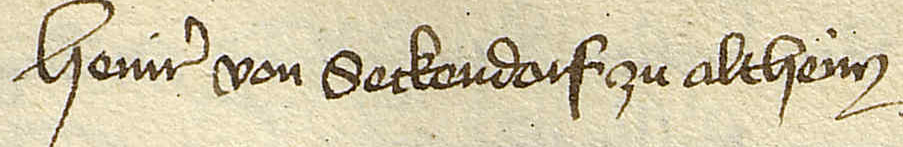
heinr* von Seckendorf cʒu altheim
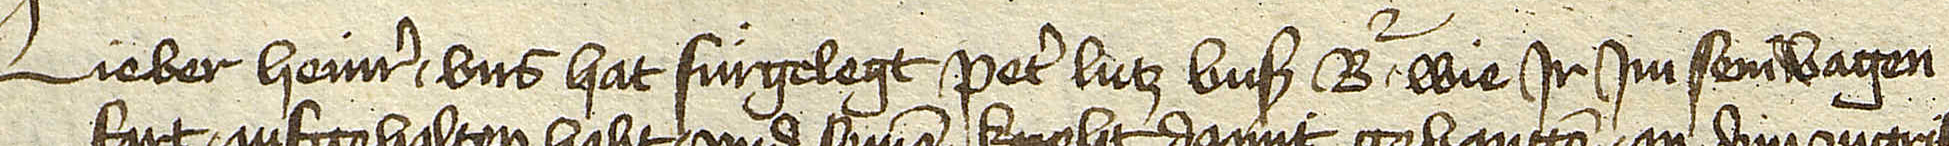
Lieber heinr* / vns hat fürgelegt Pet* lutʒ vnſ* B* / wie Ir Im ſein wagen
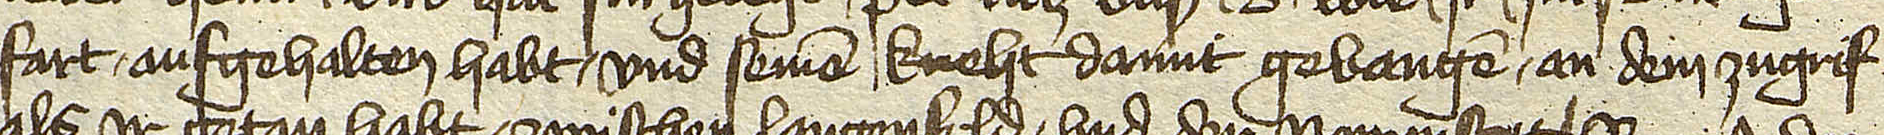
fart / aufgehalten habt / vnd ſeine* kneht damit gevange* / an dem cʒugrif
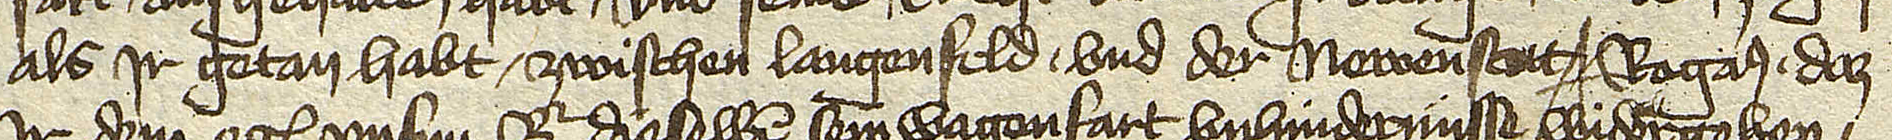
als Ir getan habt / cʒwiſchen langenfeld / vnd der Newenſtat / Roga* / daʒ
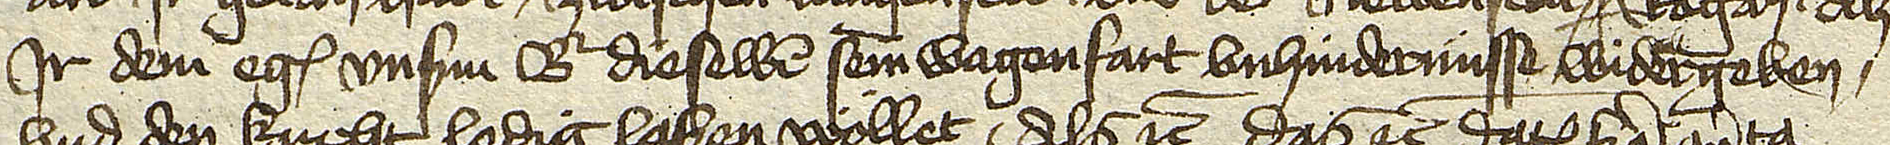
Ir dem eg* vnſ*m B* dieſelbe* ſein wagenfart vnhindernüſſe widergeben /
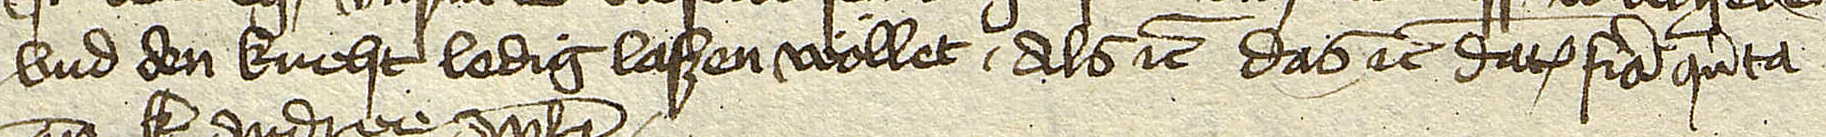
vnd den kneht ledig laſʒen wöllet / Als ec* das ec* dat* fia* qn*ta
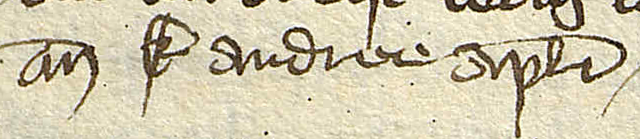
an* k Andree Apli* /
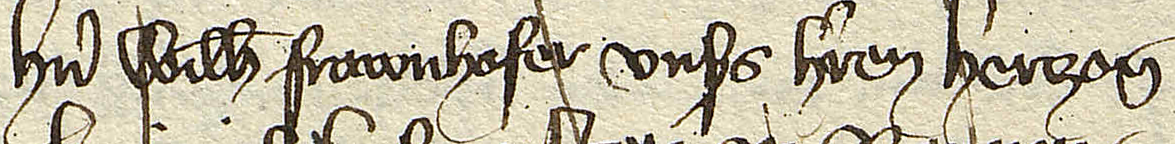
hn* Wilh* frawnhofer vnſ*s h*ren hercʒog
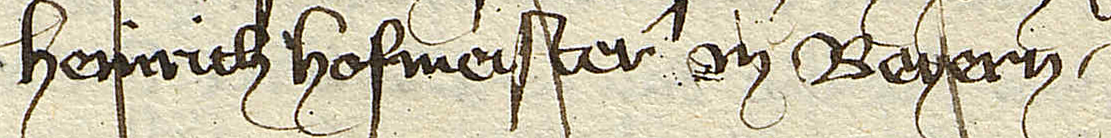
heinrich hofmeiſter in Beyern /
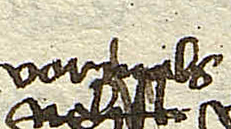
vormals
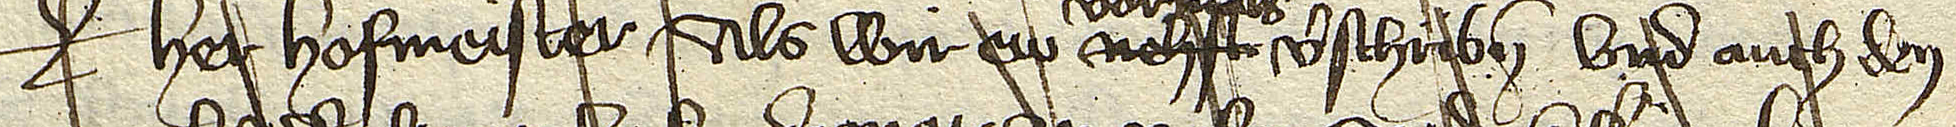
L* her hofmeiſter / Als wir ew nehſt v*ſchribn* vnd auch den
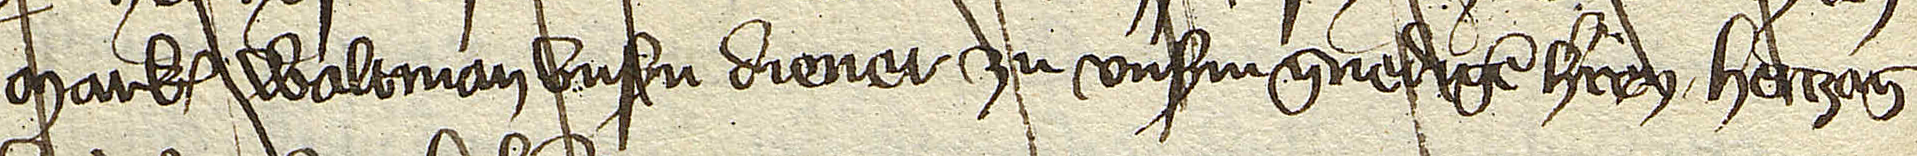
Mark* waltman vnſ*n diener cʒu vnſ*m gnedige* h*ren / hercʒog
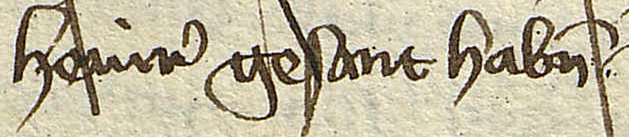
heinr* geſant habn* /
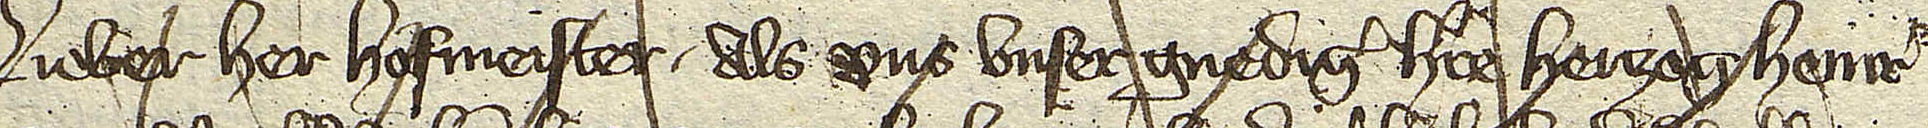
Lieber her hofmeiſter / Als vns vnſer gnedig* hercʒog heinr*
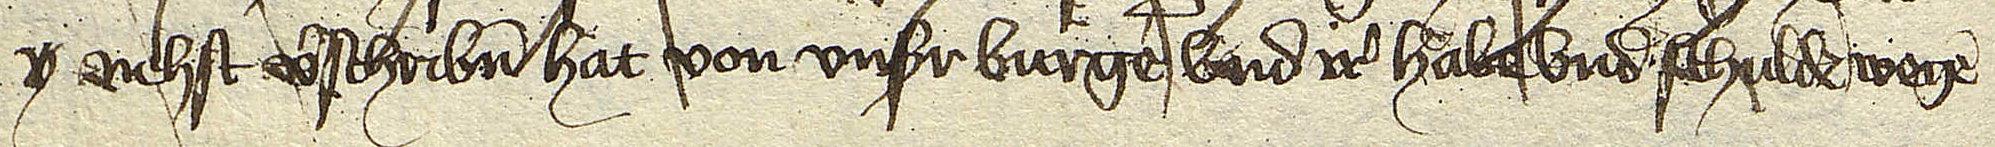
y nehſt v*ſchribn* hat von vnſ*r burge* vnd ir* habe vnd ſchulde wege*
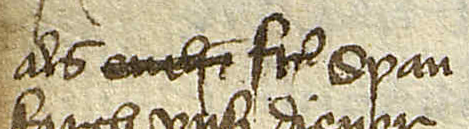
als euch* fr* Span
